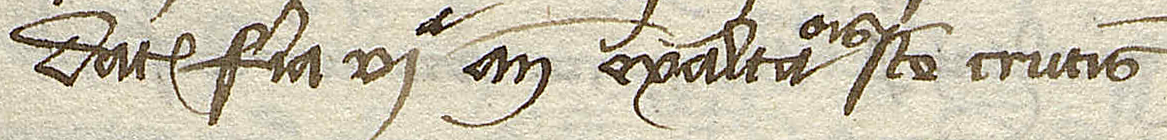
Dat* fia* vi* an* exalta* ſte* crucis
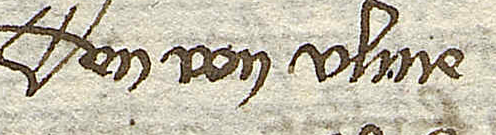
Den von vlme
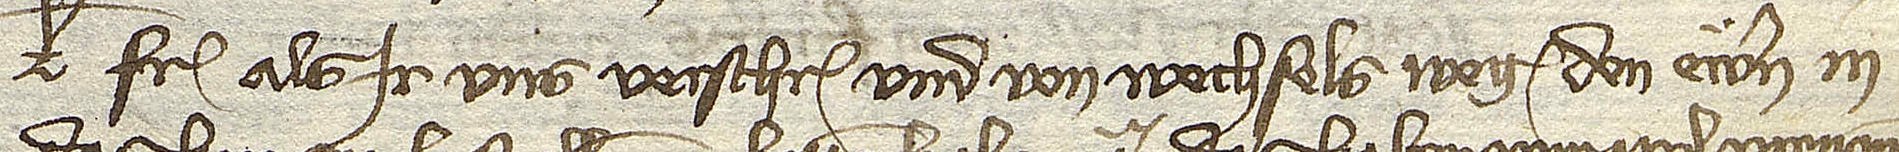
L* fr* als Ir vns verſchr* vnd von wechſels weg* / den ew*n in
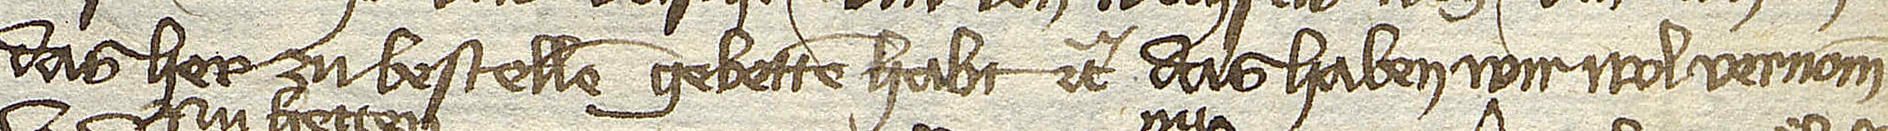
das her ʒu beſtelle* gebette* habt ec* das haben wir wol vernom*
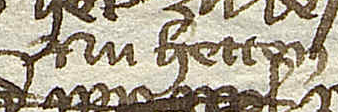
Nu hetten
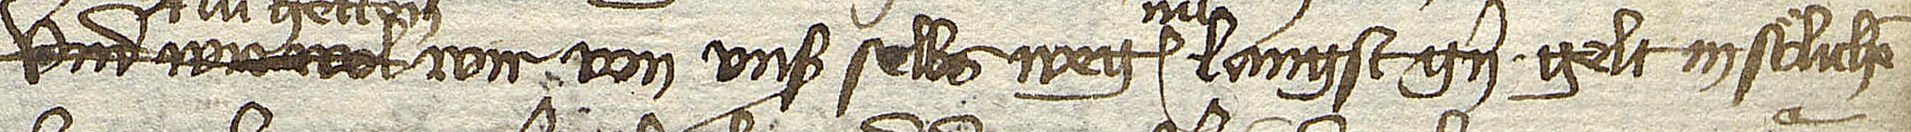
Vnd wie wol wir von vnſ* ſelbs weg* langſt gn* . gelt in ſöliche*
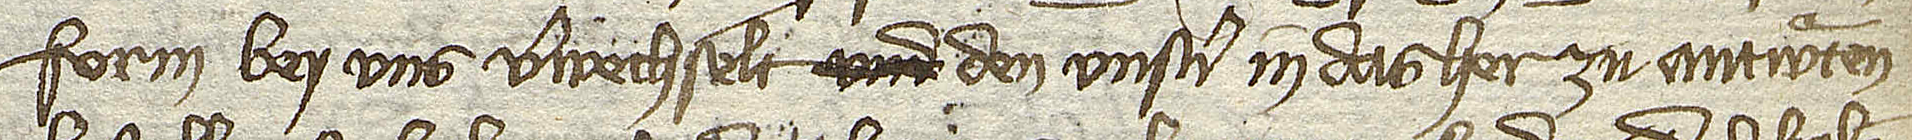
form bey vn v*wechſelt vnd den vnſ*n in das her ʒu antw*ten
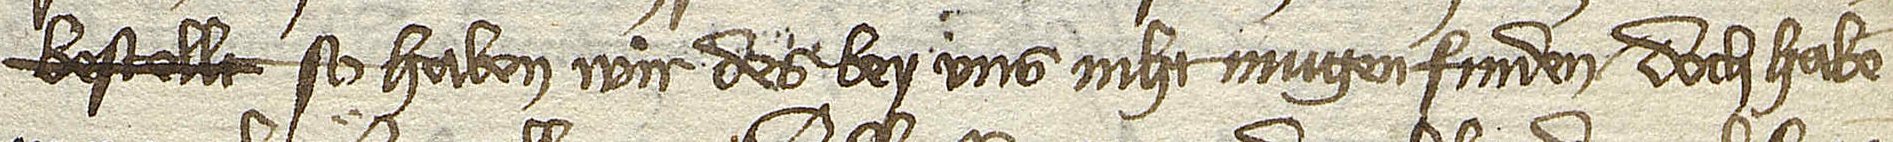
beſtellt ſo haben wir des bey vns niht mugen finden / Doch habe*
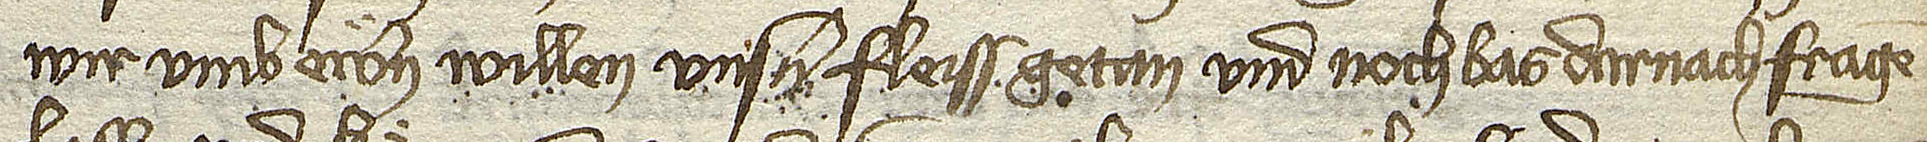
wir vmb ewn* willen vnſ*n fleiſſ getan vnd noch bas darnach frage*
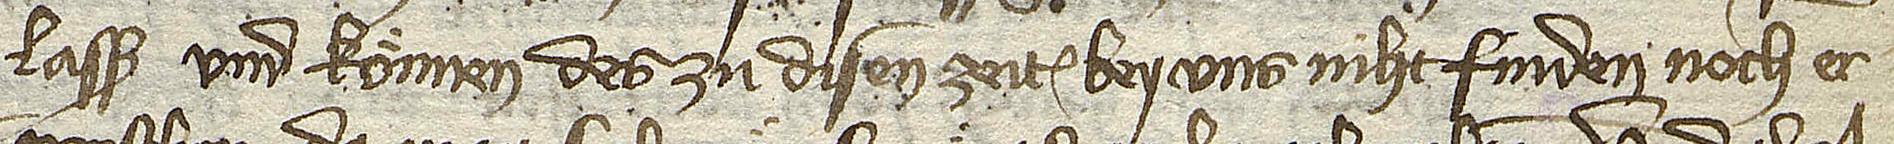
laſſ* vnd können des ʒu diſen ʒeit* bey vns niht finden noch er =
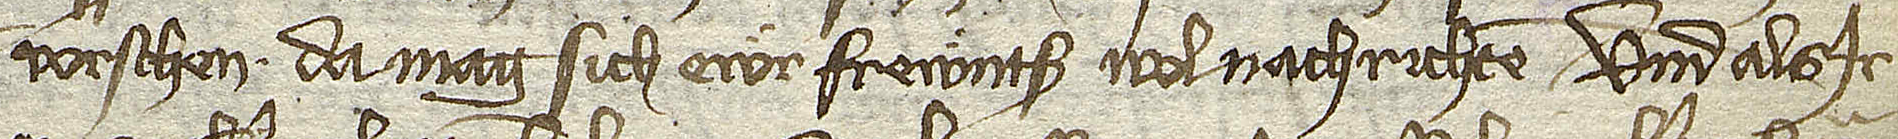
vorſchen . da mag ſich ewr frewntſ* wol nach richte* / Vnd als Ir
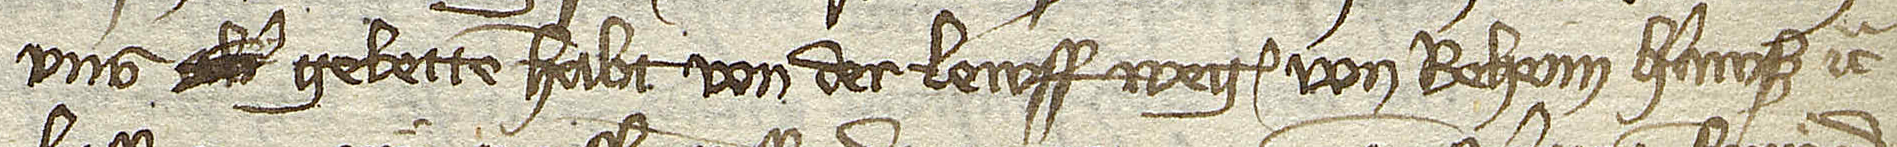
vns ab* gebette* habt von der lewff weg* von Beheim h*awſʒ ec*
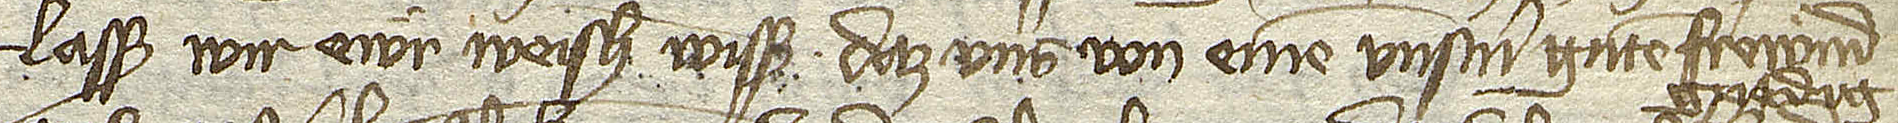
laſſ* wir ewr weiſh* wiſſ* . daʒ vns von eine* vnſ*m gute* frewnd
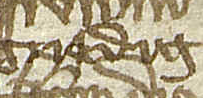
gnedig
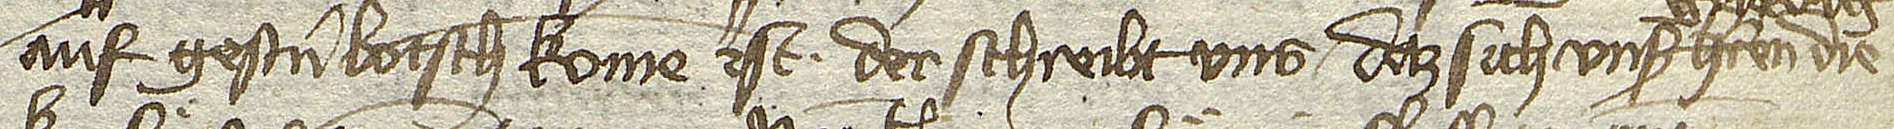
auf geſt*n botſch* kome* iſt . der ſchreibt vns / daʒ ſich vnſ* hr*en die
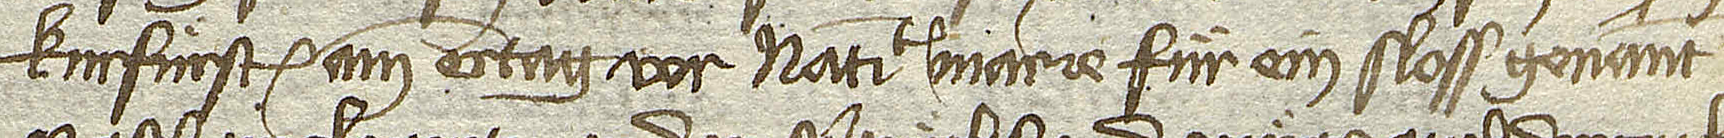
kurfürſt* am* ertag vor Nati* marie für ein ſloſſ genant*
